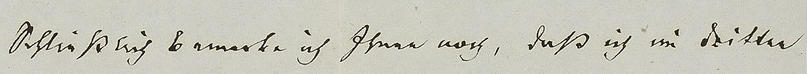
Schließlich bemerke ich Ihnen noch, daß ich im dritten
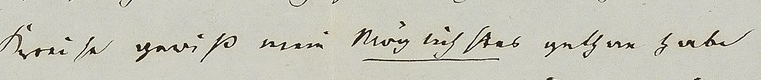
Kreise gewiß mein Möglichstes gethan habe
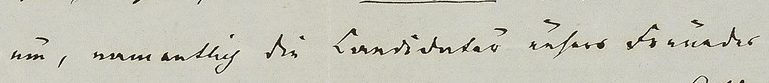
um, namentlich die Candidatur unsers Freundes
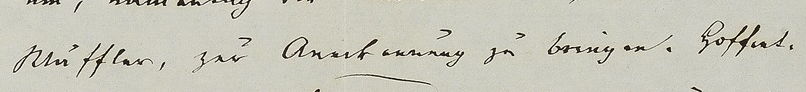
Wäffler, zur Anerkennung zu bringen. Hoffent-
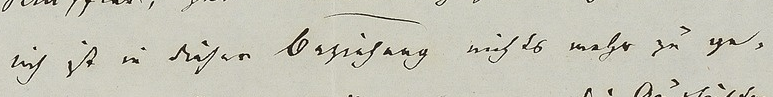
lich ist in dieser Beziehung nichts mehr zu ge-
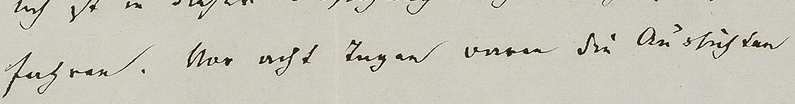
fahren. Vor acht Tagen waren die Aussichten
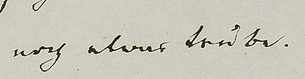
noch etwas trübe.
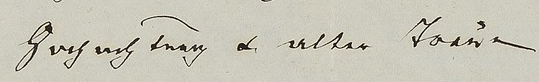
Hochachtung & alter Treue
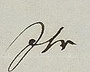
Ihr
